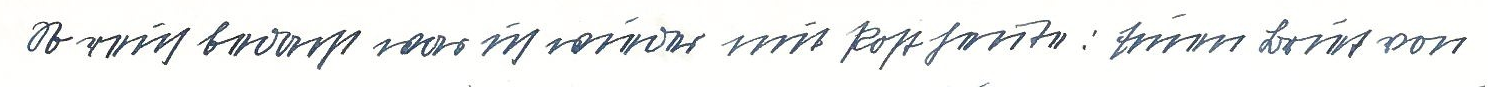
So reich bedacht war ich wieder mit Post heute: Einen Brief von
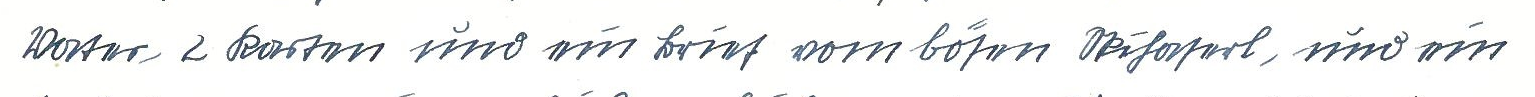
Vater, 2 Karten und ein Brief vom bösen Skihaserl, und ein
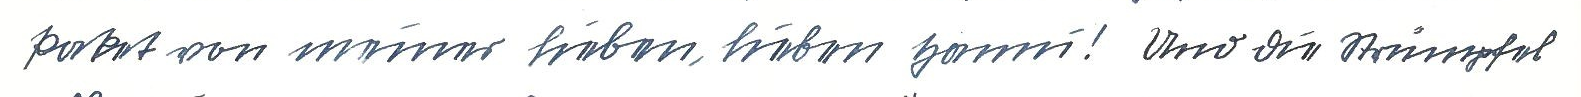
Paket von meiner lieben, lieben ! Und die Strümpfel
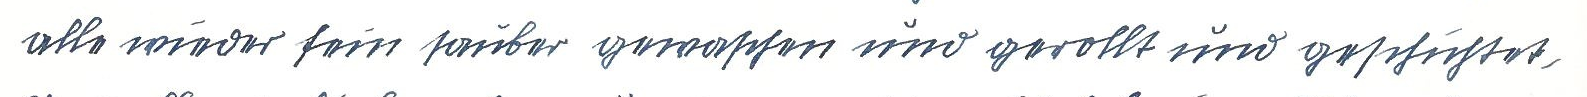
alle wieder fein sauber gewaschen und gerollt und geschichtet,
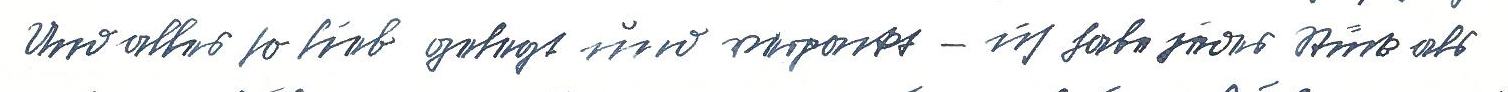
Und alles so lieb gelegt und verpackt – ich habe jedes Stück als
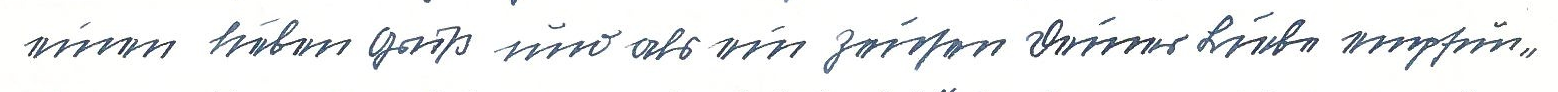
einen lieben Gruß und als ein Zeichen Deiner Liebe empfun¬
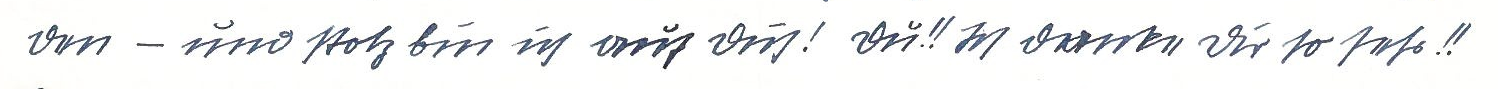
den – und stolz bin ich auf Dich! Du!! Ich danke Dir so sehr!!
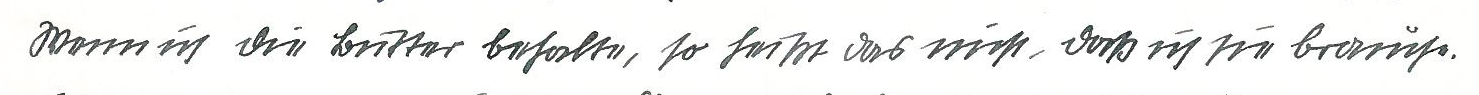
Wenn ich die Butter behalte, so heißt das nicht, daß ich sie brauche.
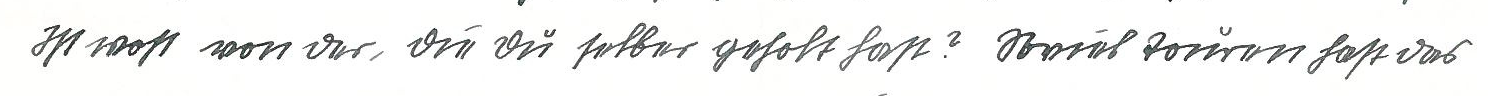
Ist wohl von der, die Du selber geholt hast? So viel Touren hast das
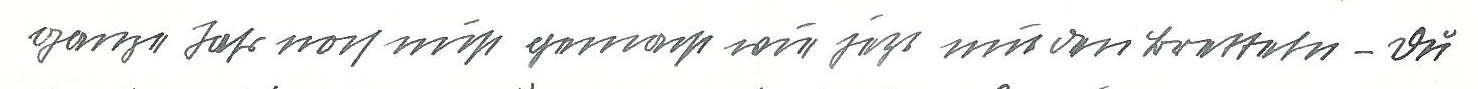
ganze Jahr noch nicht gemacht wie jetzt mit den Bretteln – Du
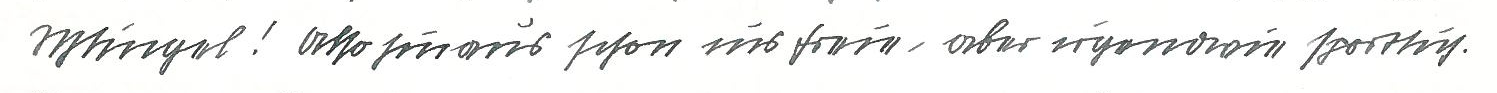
Schlingel! Also hinaus schon ins Freie, aber irgendwie sportlich.
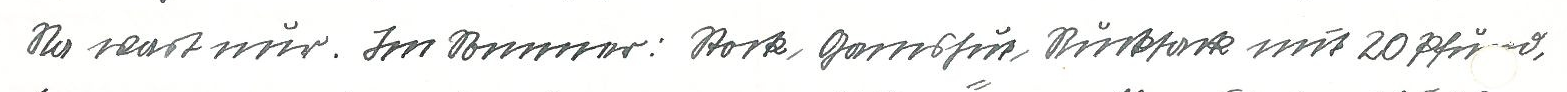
Na wart nur. Im Sommer: Stock, Gamshut, Rucksack mit 20 Pfud,
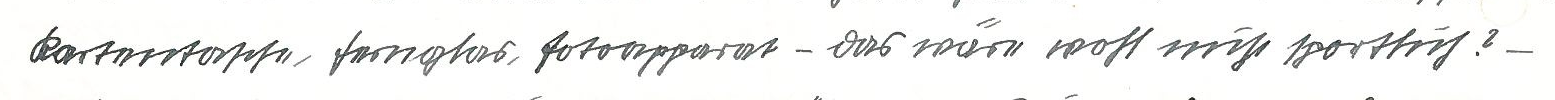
Kartentasche, Fernglas, Fotoapparat – das wäre wohl nicht sportlich? –
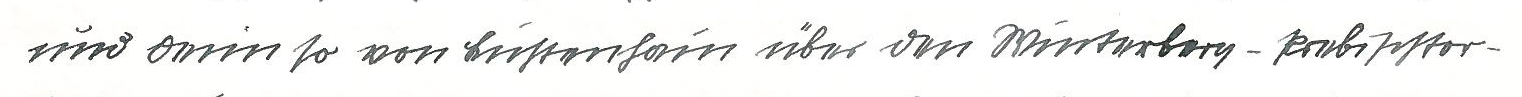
und denn so von L. über den W.berg – P. –
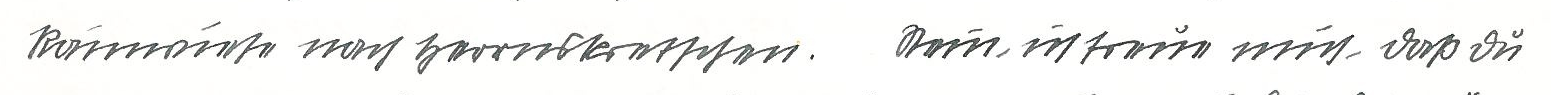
R. nach H. Nein, ich freue mich, daß Du
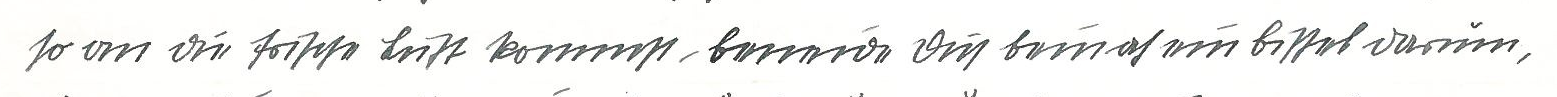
so an die frische Luft kommst, beneide Dich beinah ein bissel darum,
